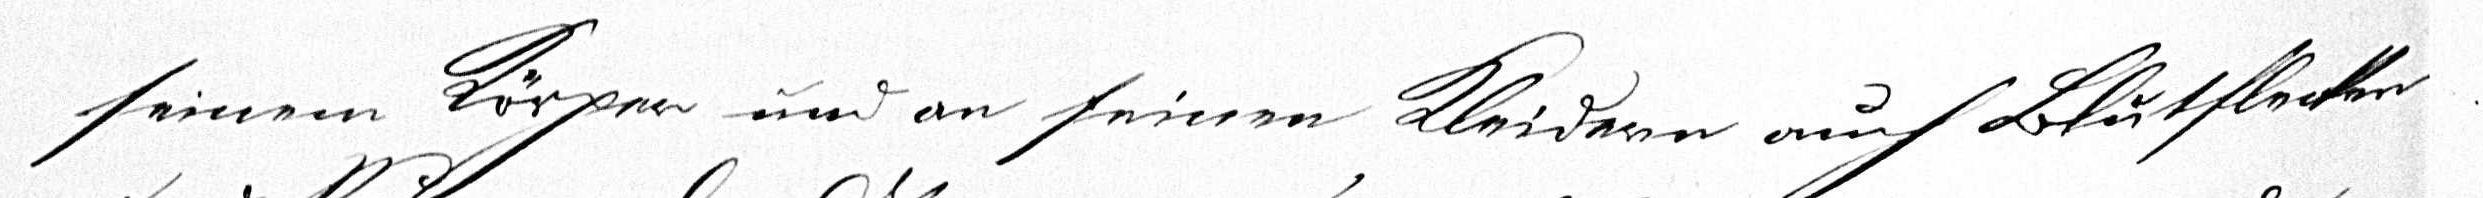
seinem Körper und an seinen Kleidern auch Blutflecken
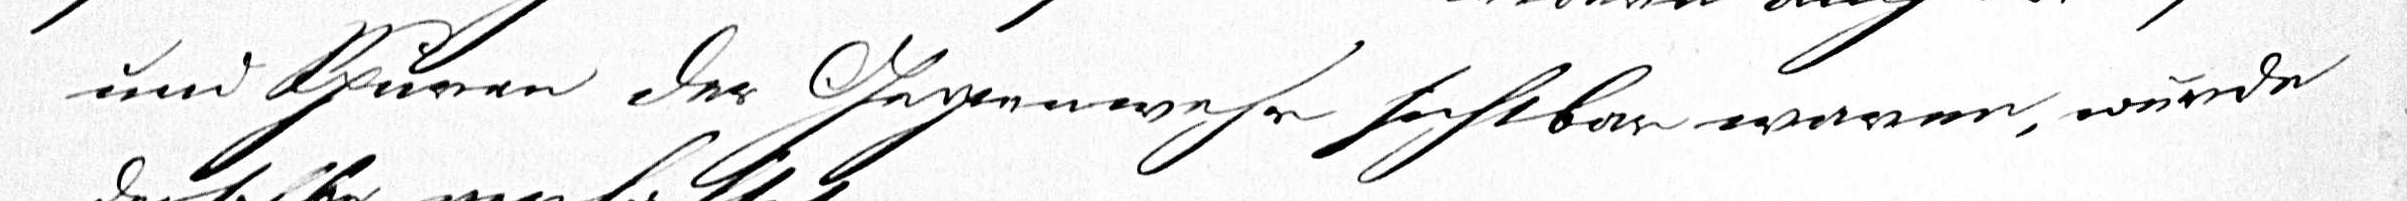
und Spuren der Gegenwehr sichtbar waren, wurde
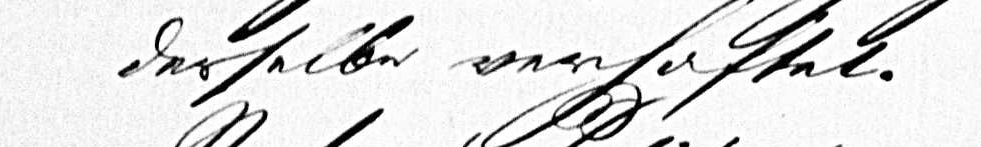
derselbe verhaftet.
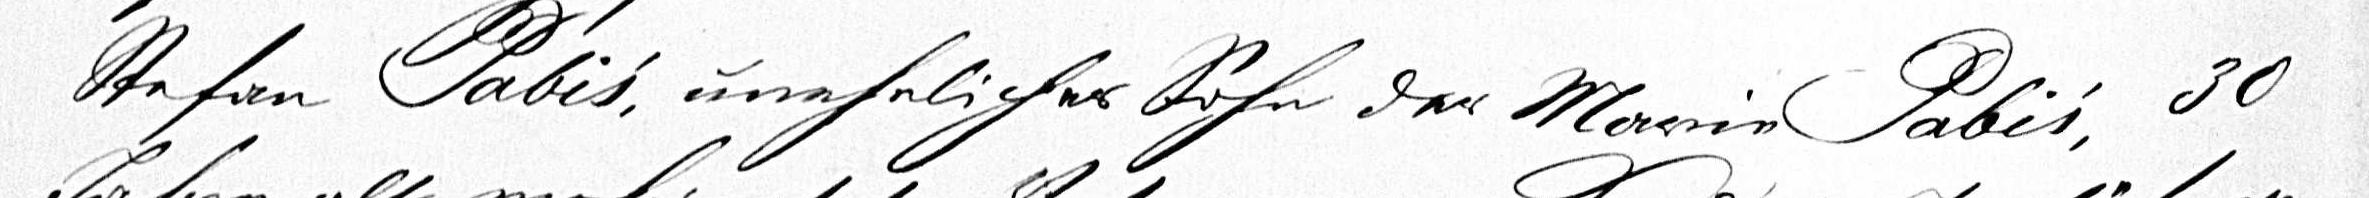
Stefan Pabiś, unehelicher Sohn der Marie Pabiś, 30
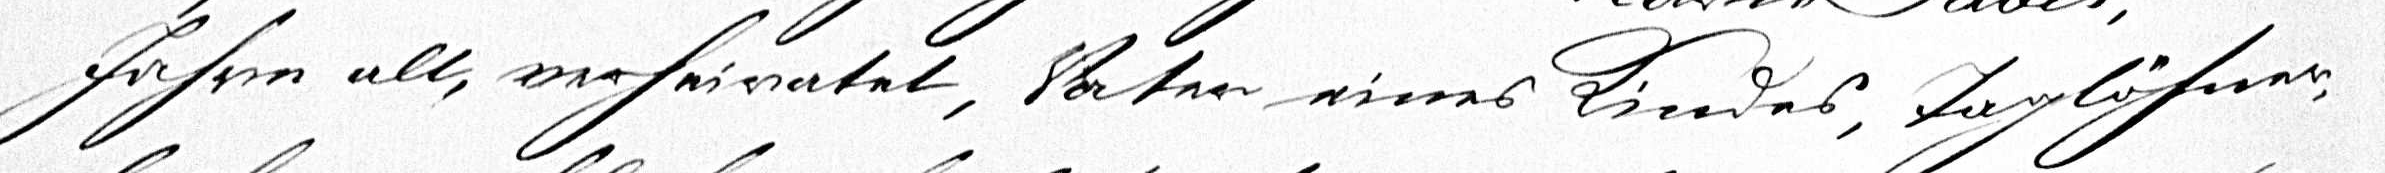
Jahre alt, verheiratet, Vater eines Kindes, Taglöhner,
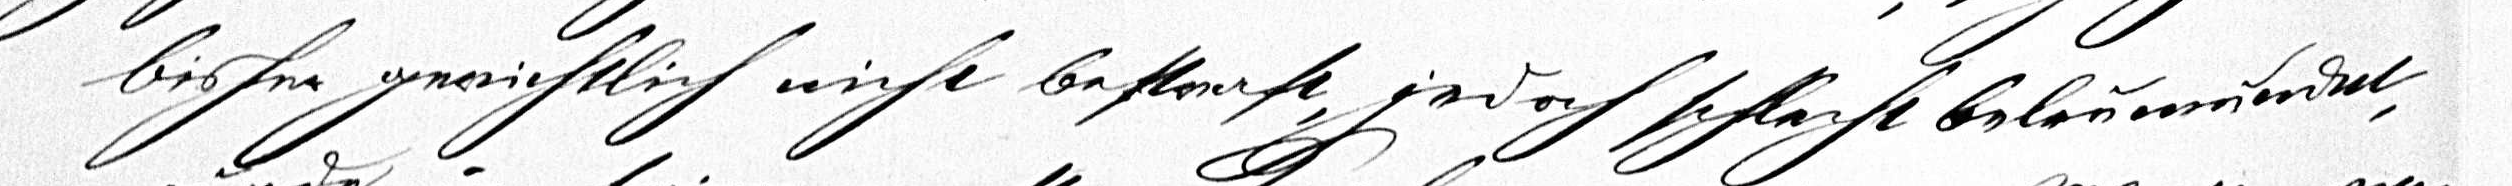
bisher gerichtlich nicht bestraft, jedoch schlecht beleumundet,
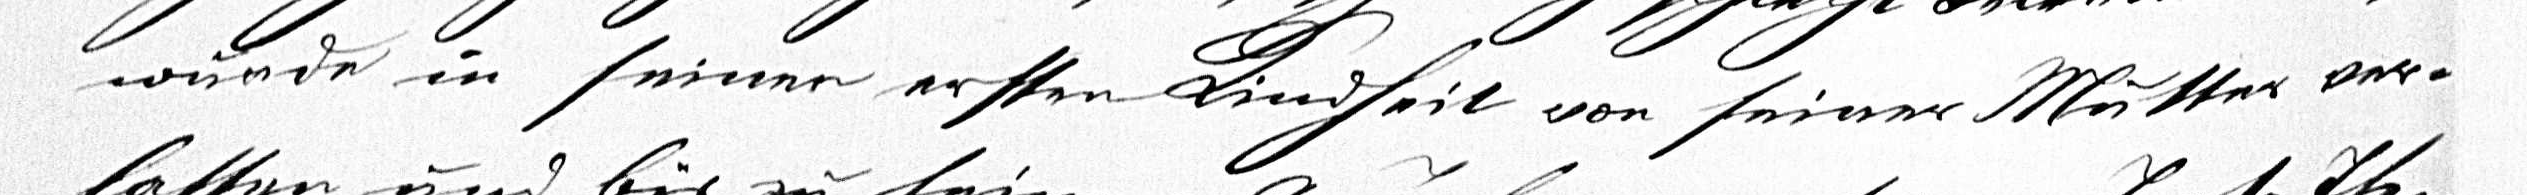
wurde in seinen ersten Kindheit von seiner Mutter ver¬
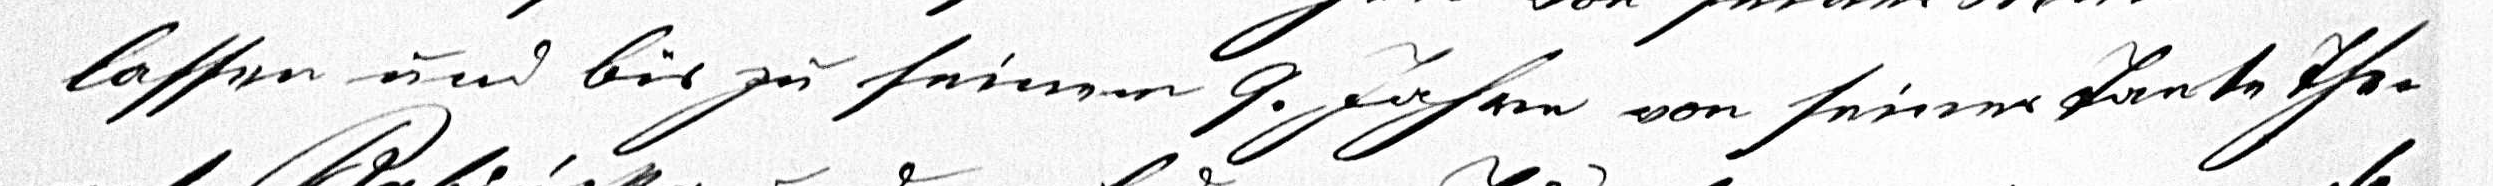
lassen und bis zu seinem 9. Jahre von seiner Tante The¬
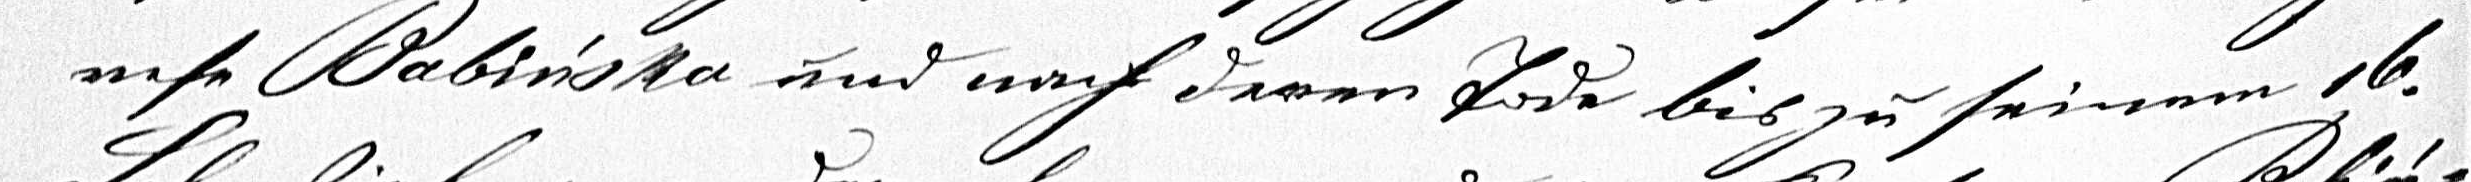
rese Babińska und nach deren Tode bis zu seinem 16.
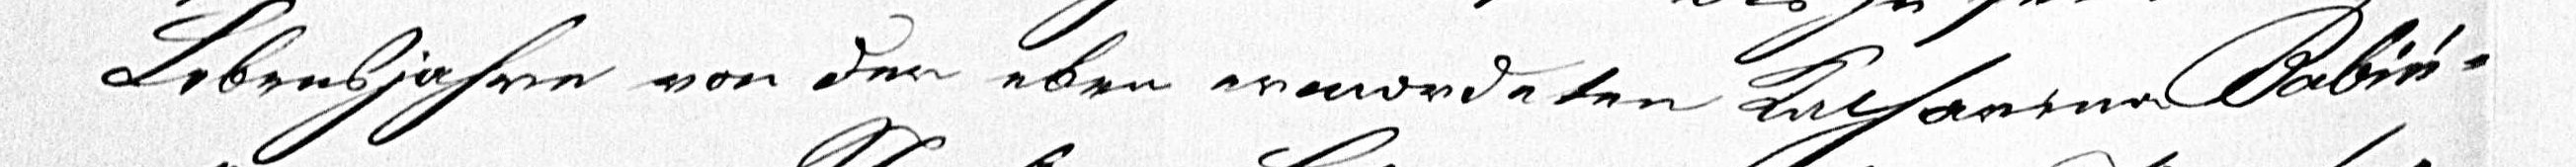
Lebensjahre von der eben xxdeten Katharina Babiń¬
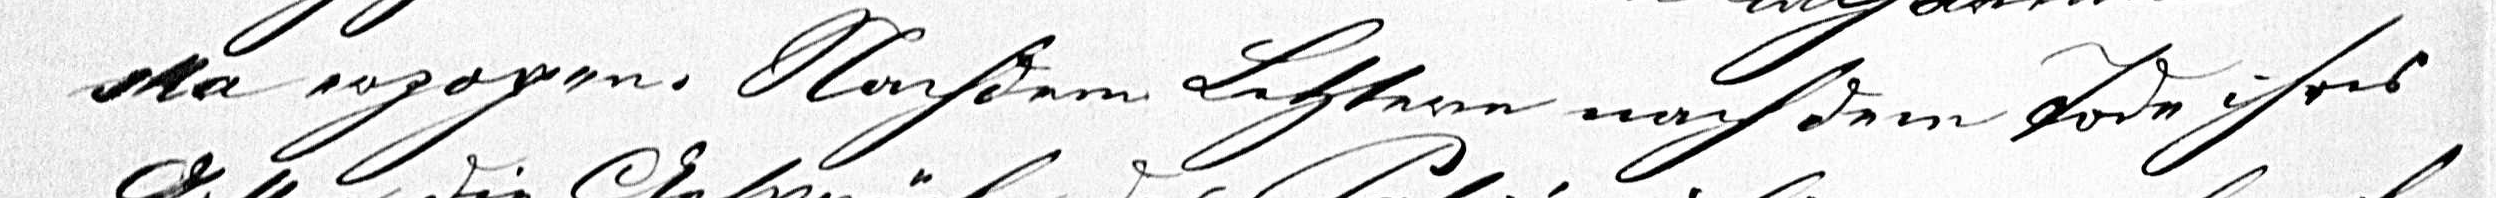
ska erzogen. Nachdem Letztere nach dem Tode ihres
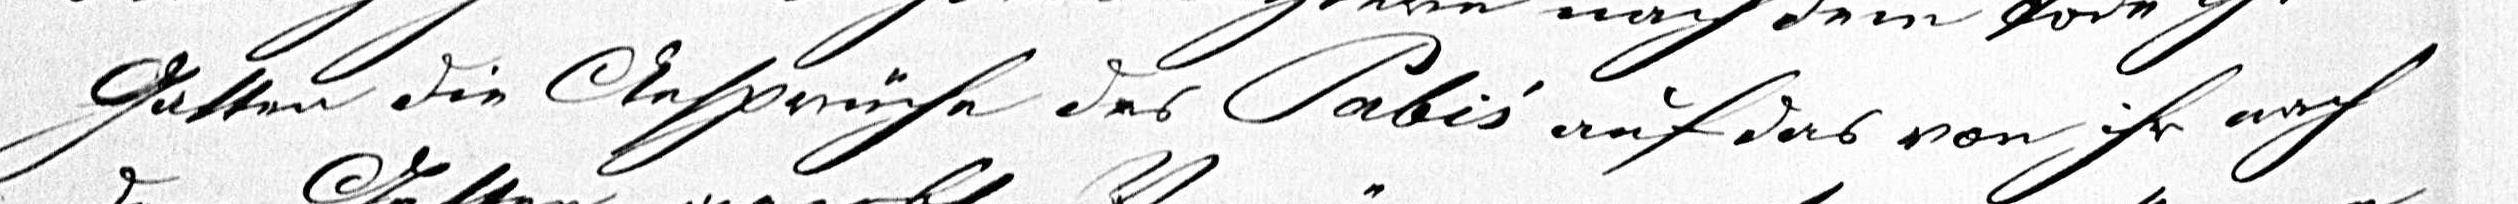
Gatten die Ansprüche des Pabiś auf das von ihr nach
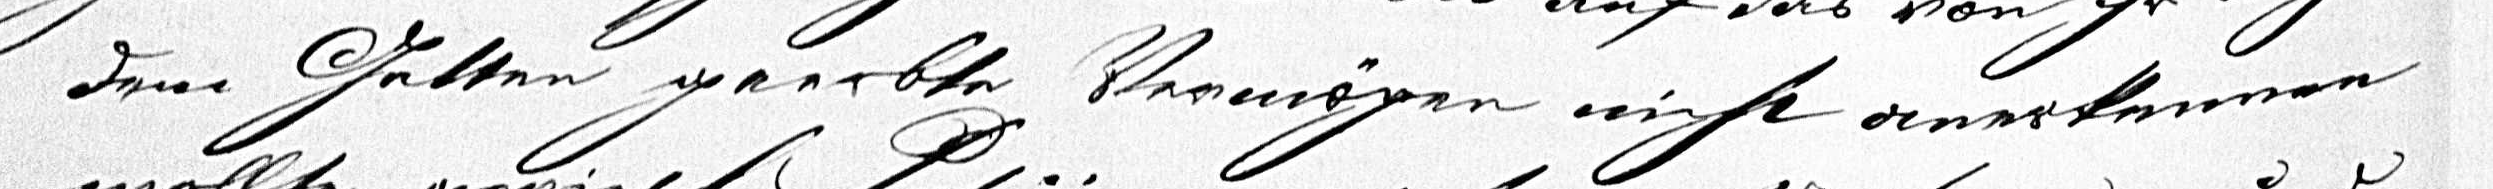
dem Getten geerbte Vermöge nicht anerkennen
